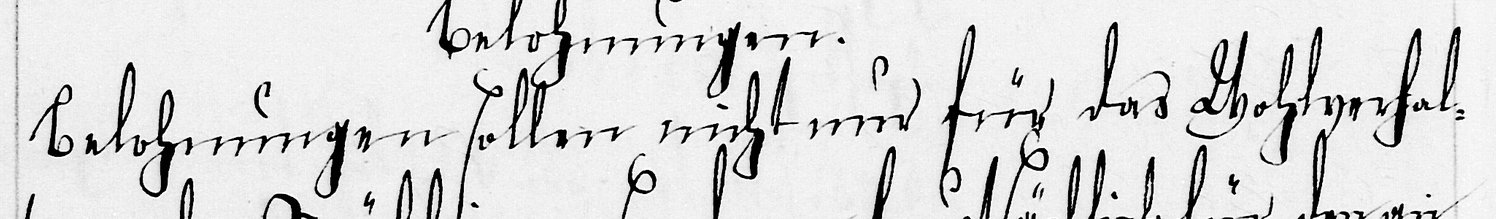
Belohnungen sollen nicht nur für das Wohlverhal¬
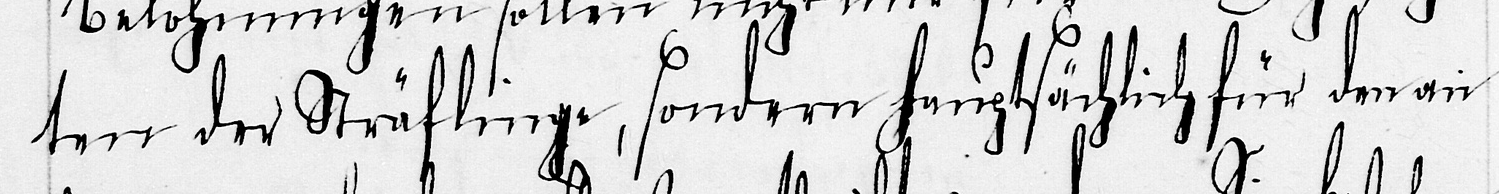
ten der Sträflinge, sondern hauptsächlich für den an
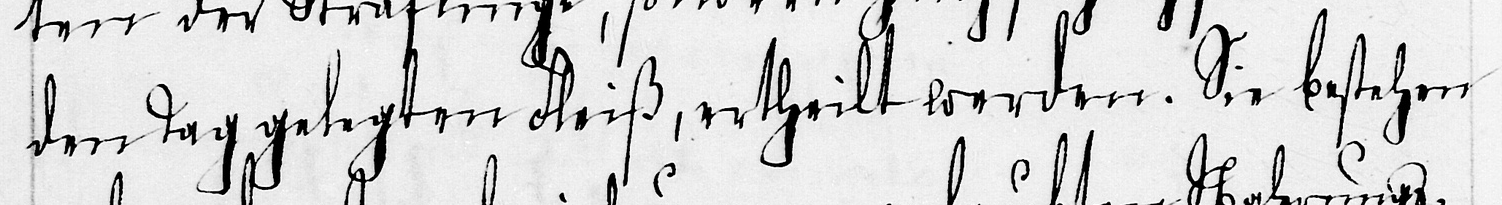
den Tag gelegten Fleiß, ertheilt werden. Sie bestehen
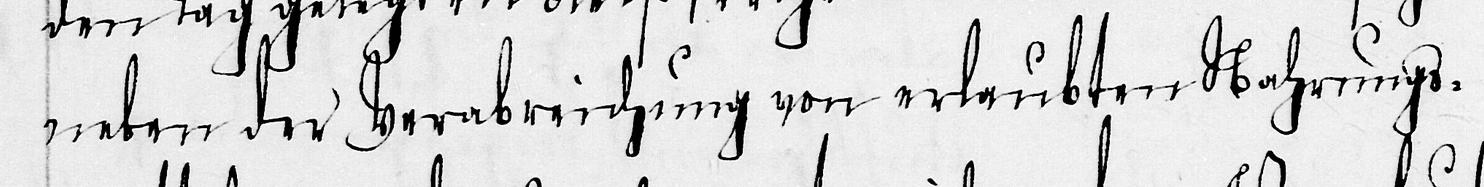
neben der Verabreichung von erlaubten Nahrungs¬
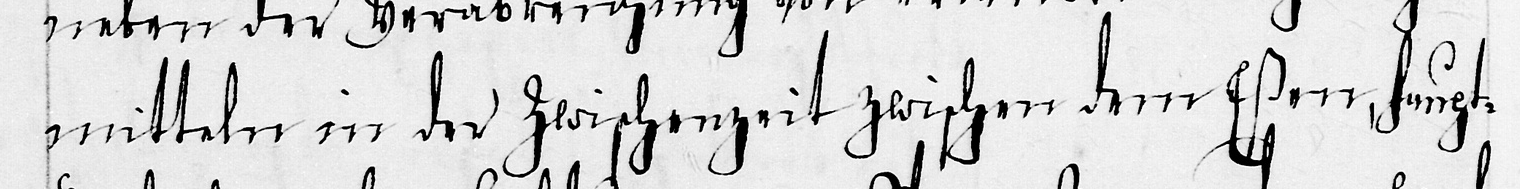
mitteln in der Zwischenzeit zwischen dem Eßen, haupt¬
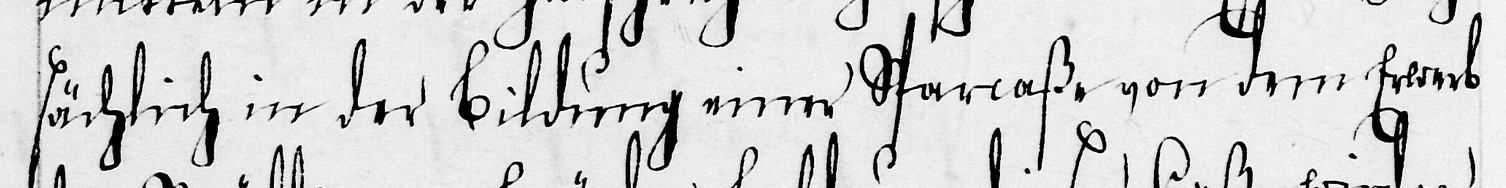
sächlich in der Bildung einer Sparcaße von dem Erwerb
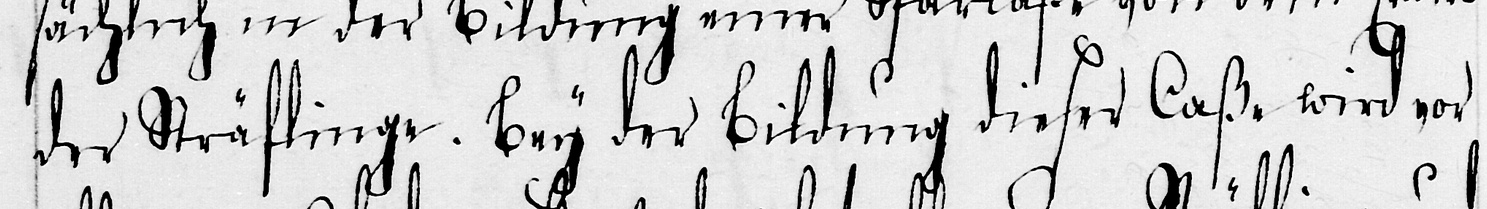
der Sträflinge. Bey der Bildung dieser Caße wird vor
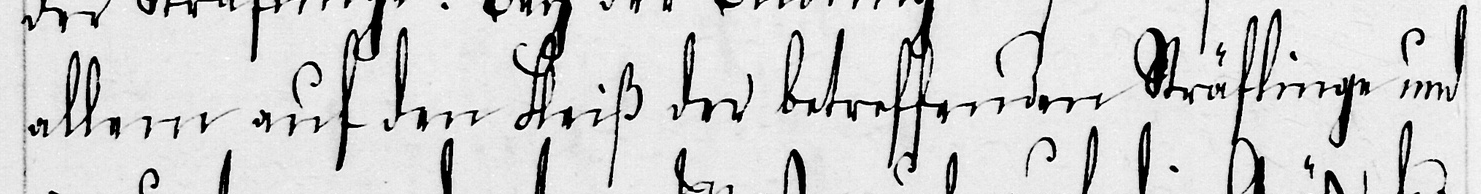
allem auf den Fleiß der betreffenden Sträflinge und
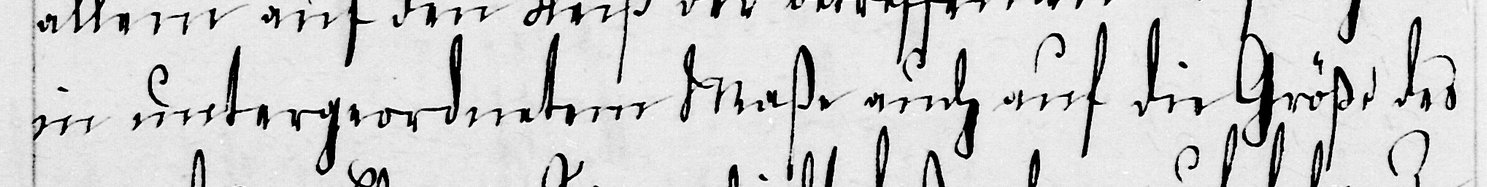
in untergeordnetem Maße auch auf die Größe des
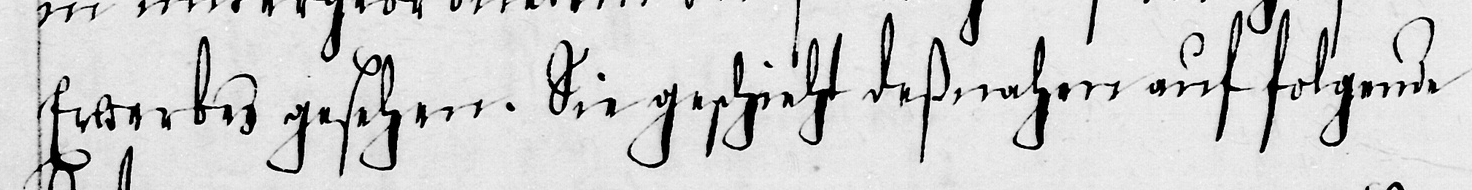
Erwerbes gesehen. Sie geschieht deßnahen auf folgende
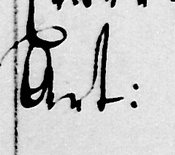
Art:
